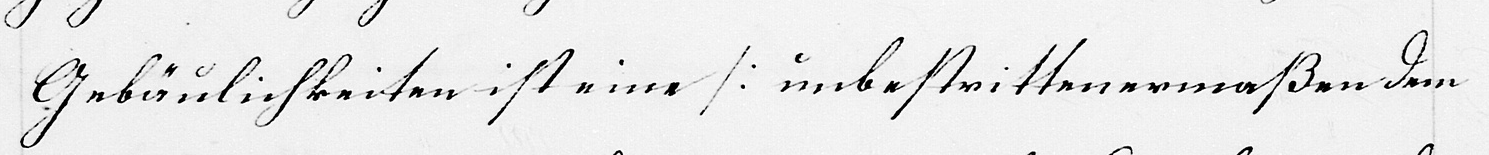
Gebäulichkeiten ist eine [unbestrittenermaßen dem
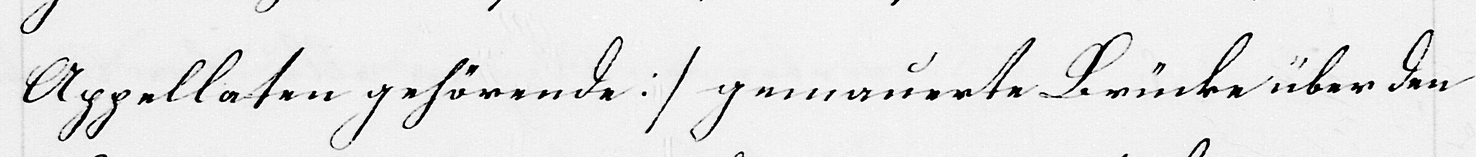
Appellaten gehörende] gemauerte Brücke über den
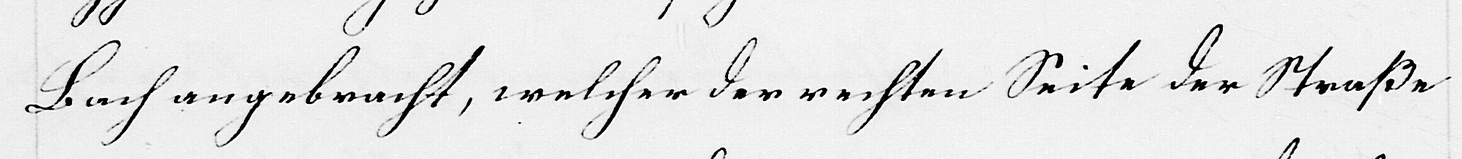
Bach angebracht, welcher der rechten Seite der Straße
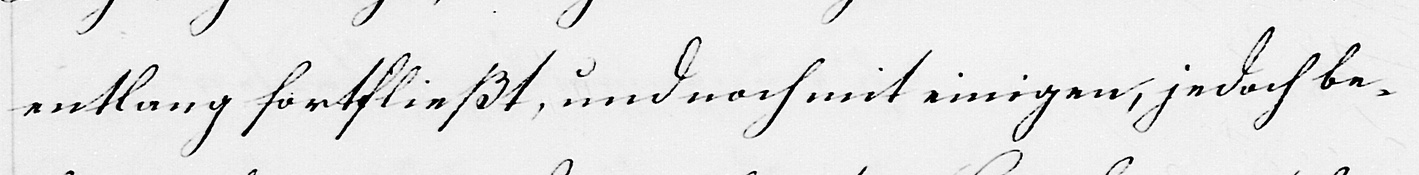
entlang fortfließt, und noch mit einigen, jedoch be¬
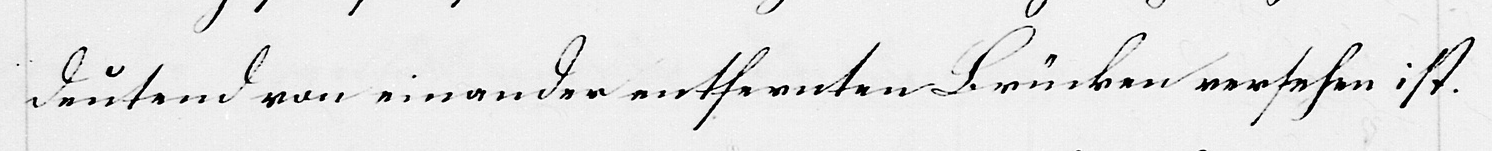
deutend von einander entfernten Brücken versehen ist.
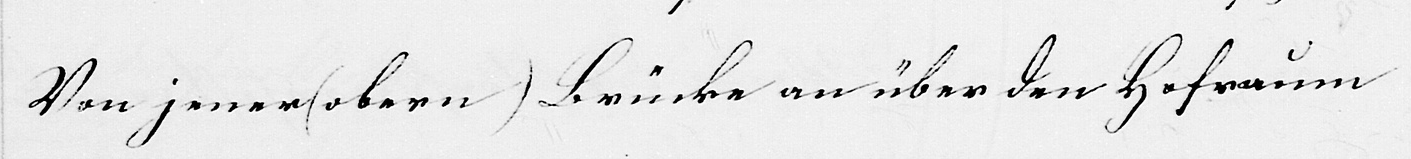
Von jener (obern) Brücke an über den Hofraum
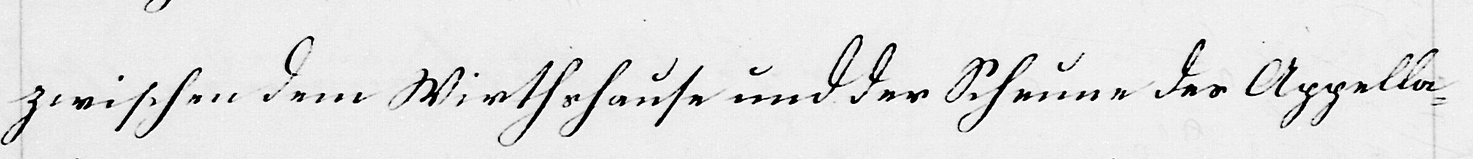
zwischen dem Wirthshause und der Scheune des Appella¬
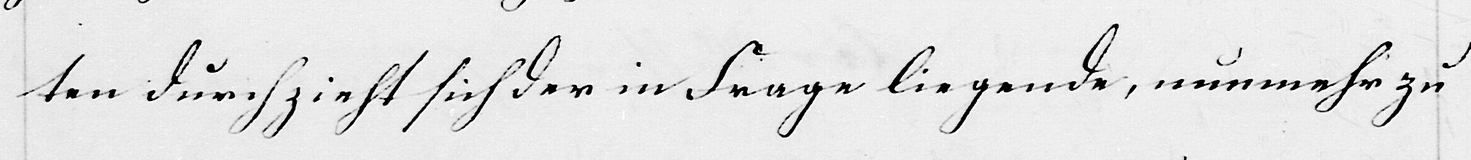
ten durchzieht sich der in Frage liegende, nunmehr zu
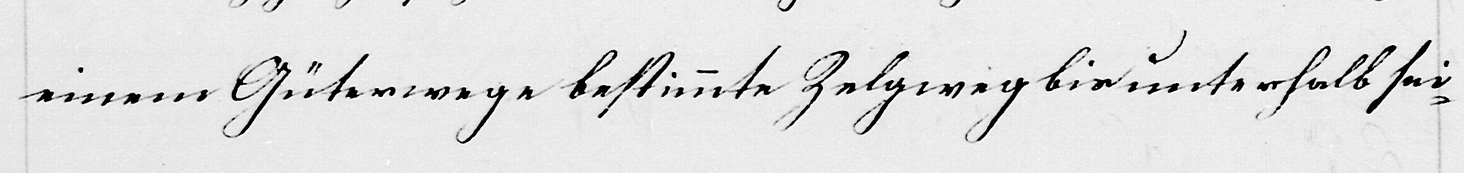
einem Güterwege bestimmte Zelgweg bis unterhalb sei-
